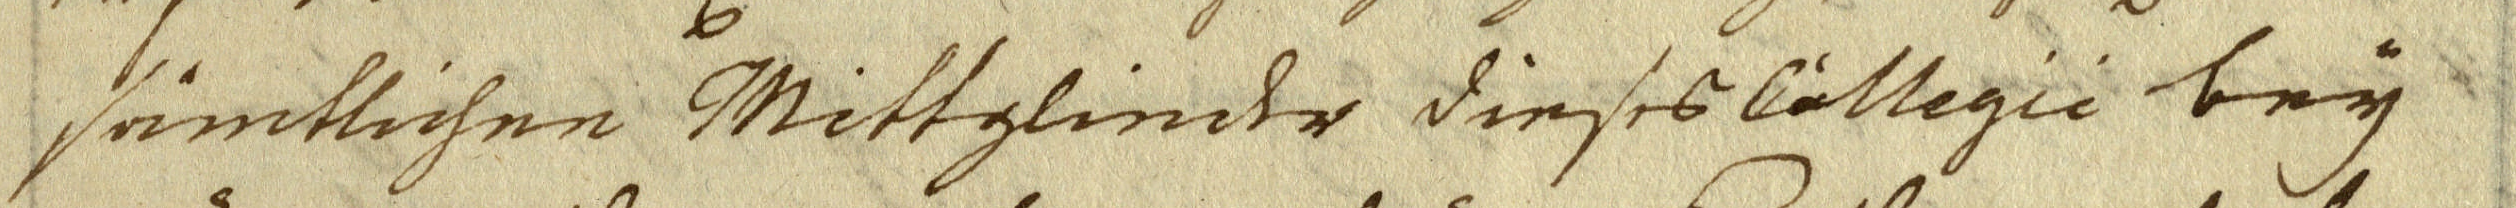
sämtlichen Mittglieder dieses Collegii beÿ
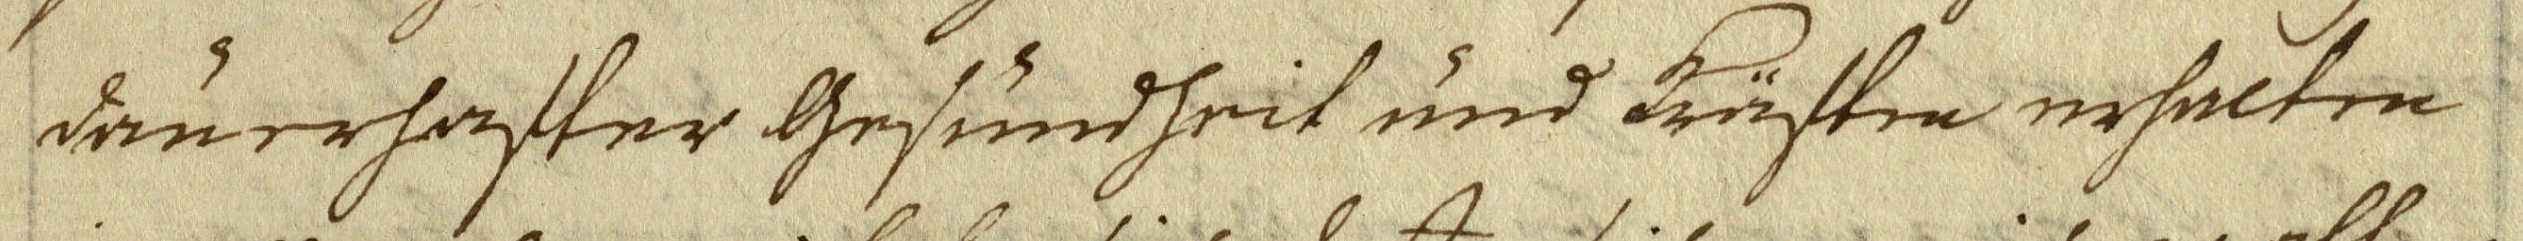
dauerhafter Gesundheit und Kräften erhalten
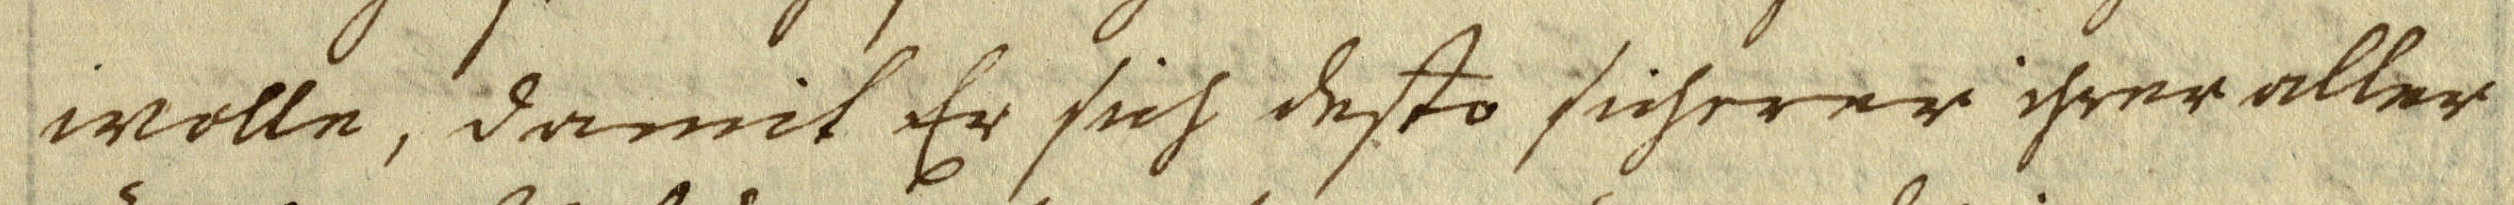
wolle, damit Er sich desto sicherer ihrer aller
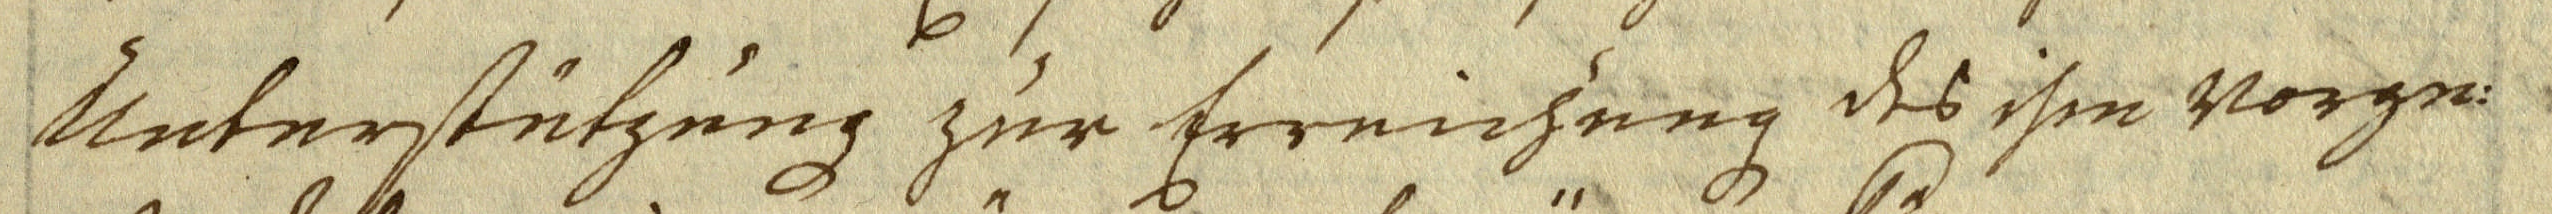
Unterstützung zur Erreichung des ihm vorge¬
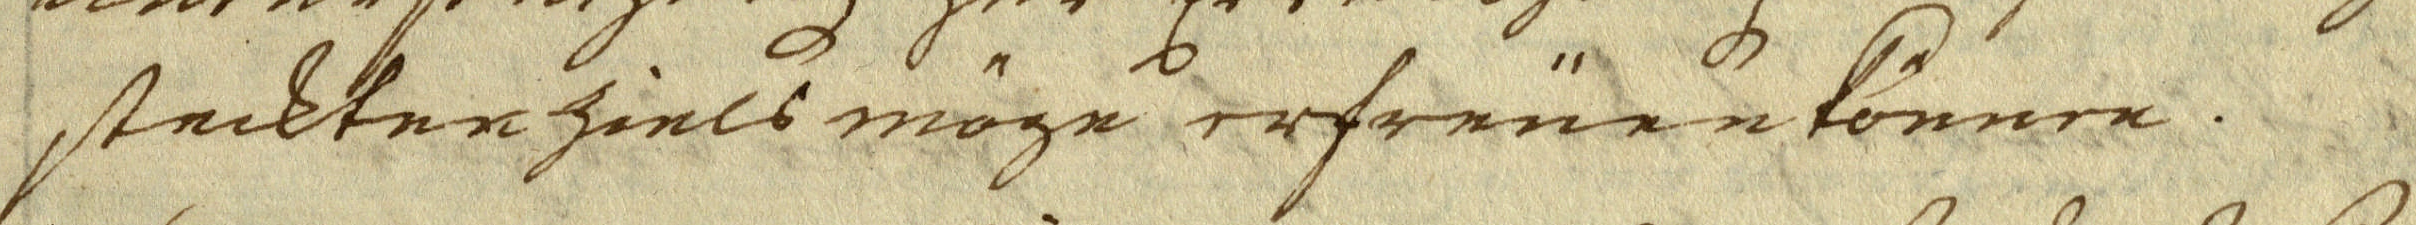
steckten Ziels möge erfreuen können.
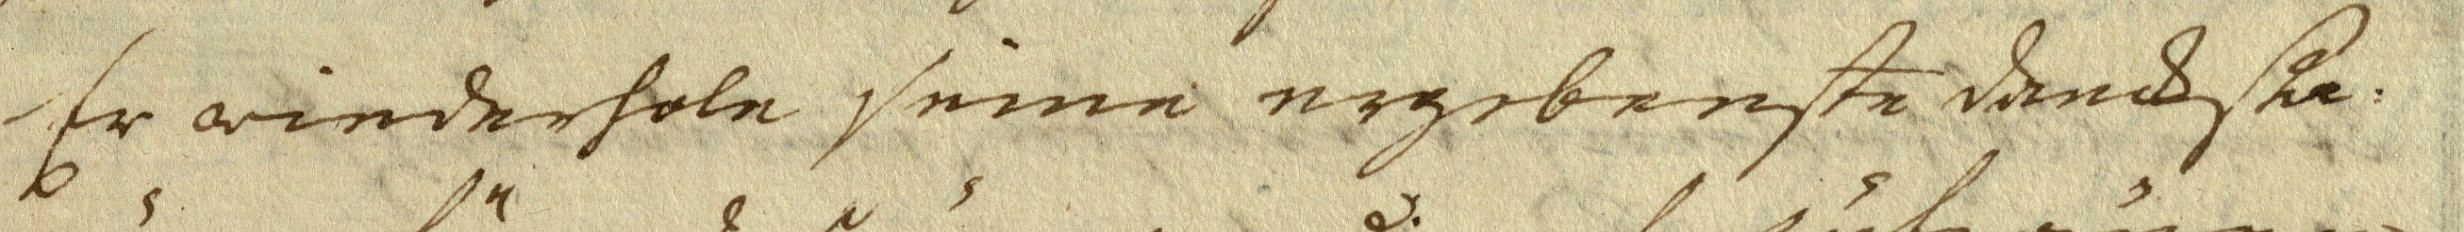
Er wiederhole seine ergebenste Dancksa¬
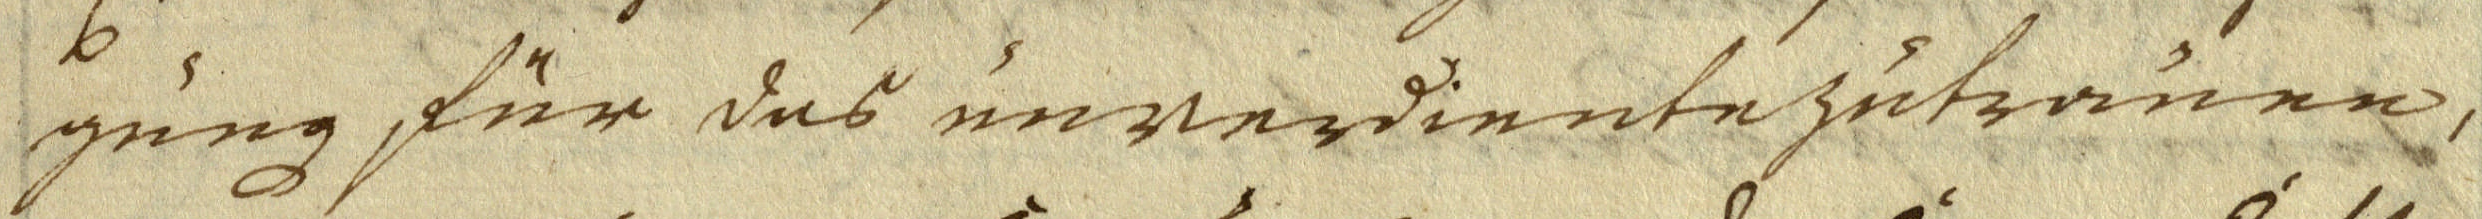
gung für das unverdientezutrauen,
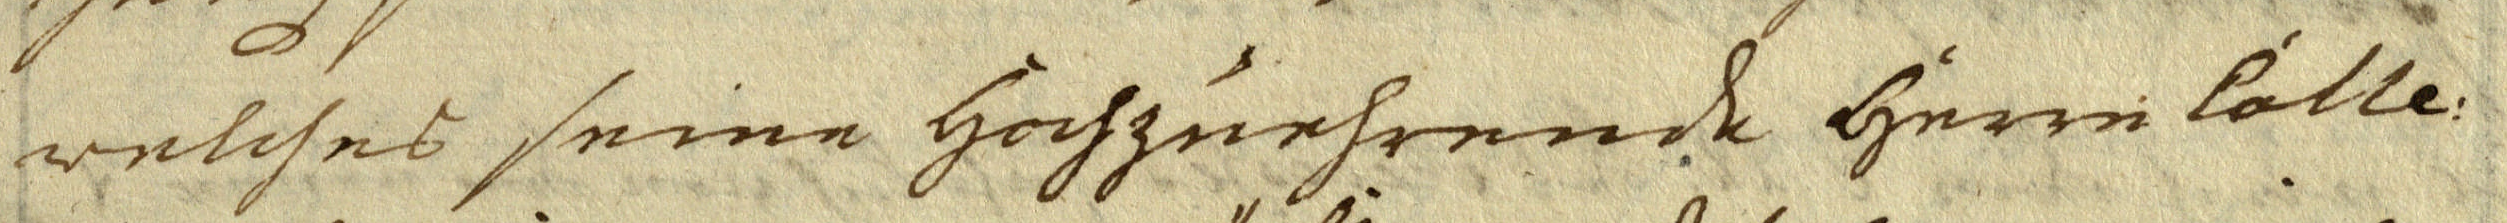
welches seine Hochzuehrende Herrn Colle¬
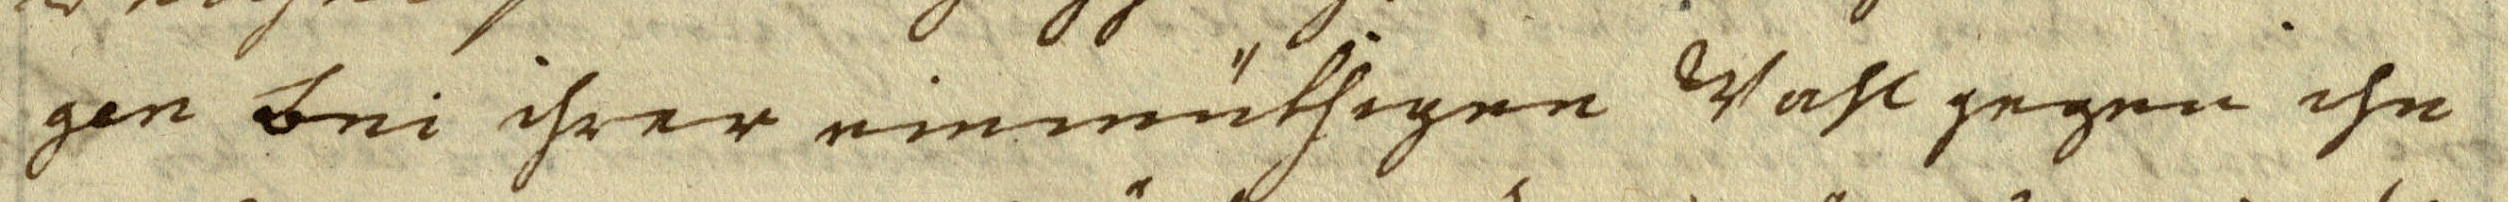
gen bei ihrer einmüthigen Wahl gegen ihn
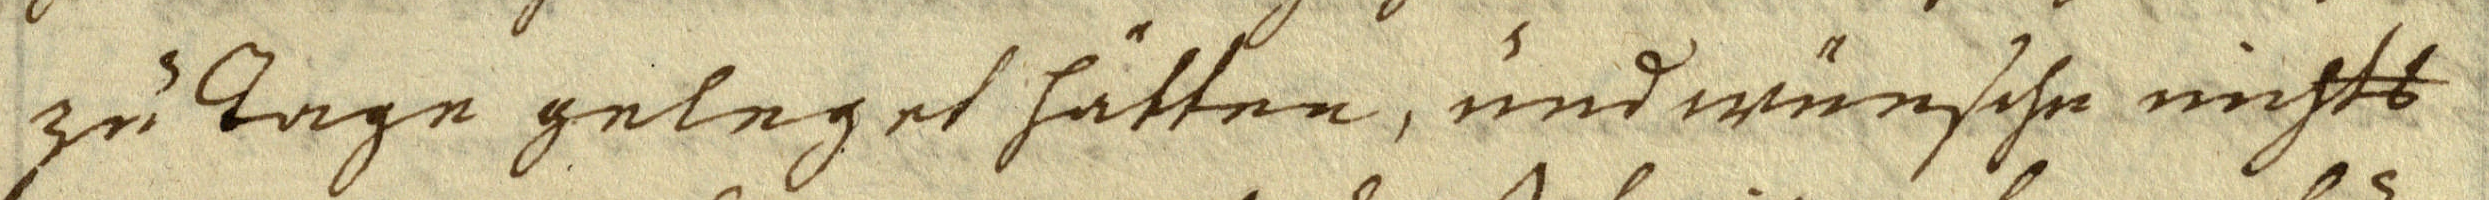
zu Tage geleget hätten, und wünsche nichts
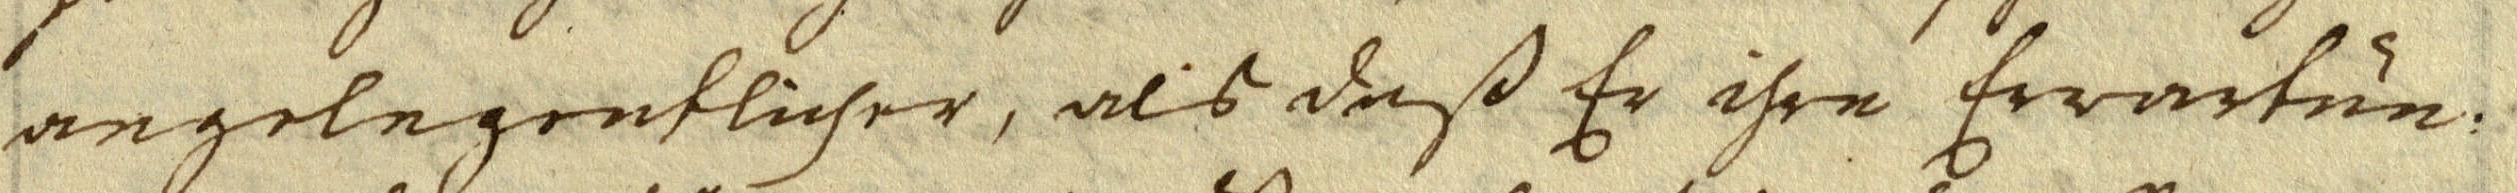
angelegentlicher, als daß Er ihre Erwartun¬
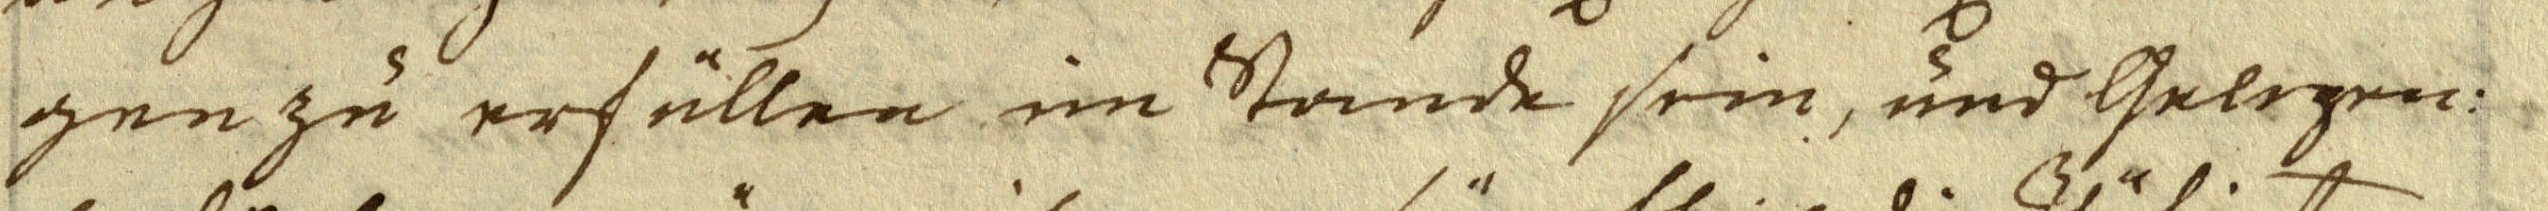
gen zu erfüllen im Stande sein, und Gelegen¬
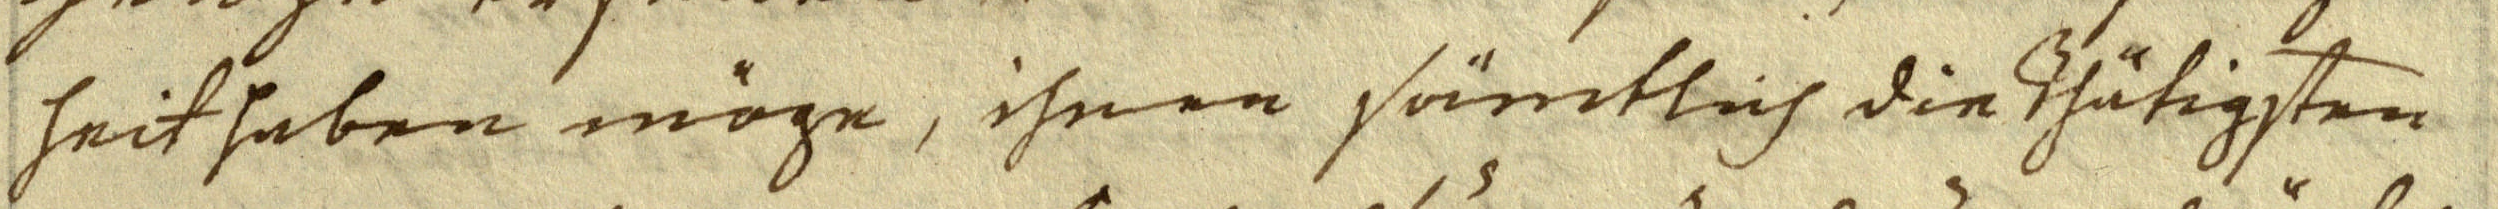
heit haben möge, ihnen sämtlich die Thätigsten
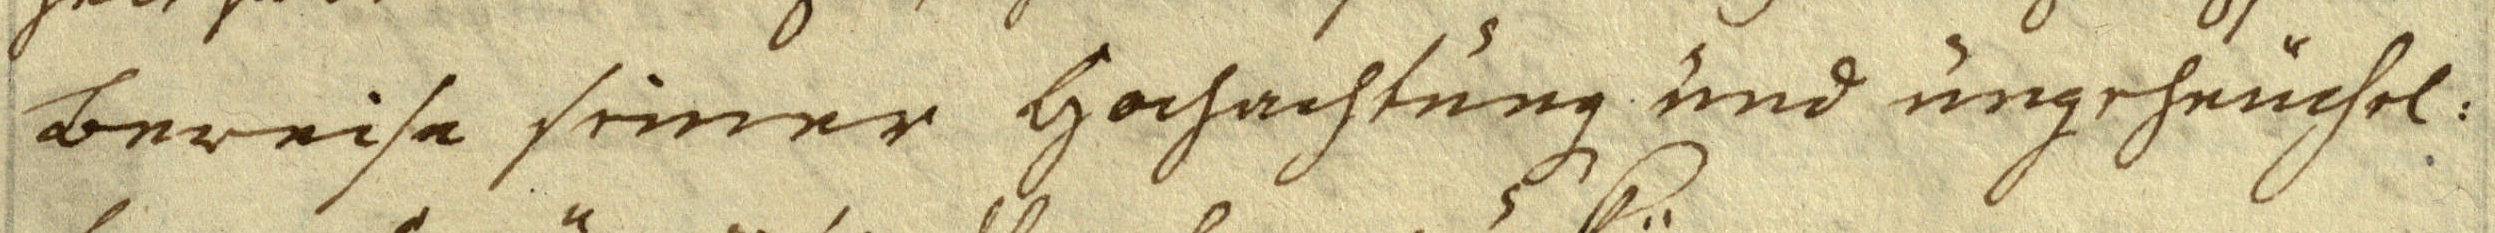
Beweise seiner Hochachtung und ungeheuchel¬
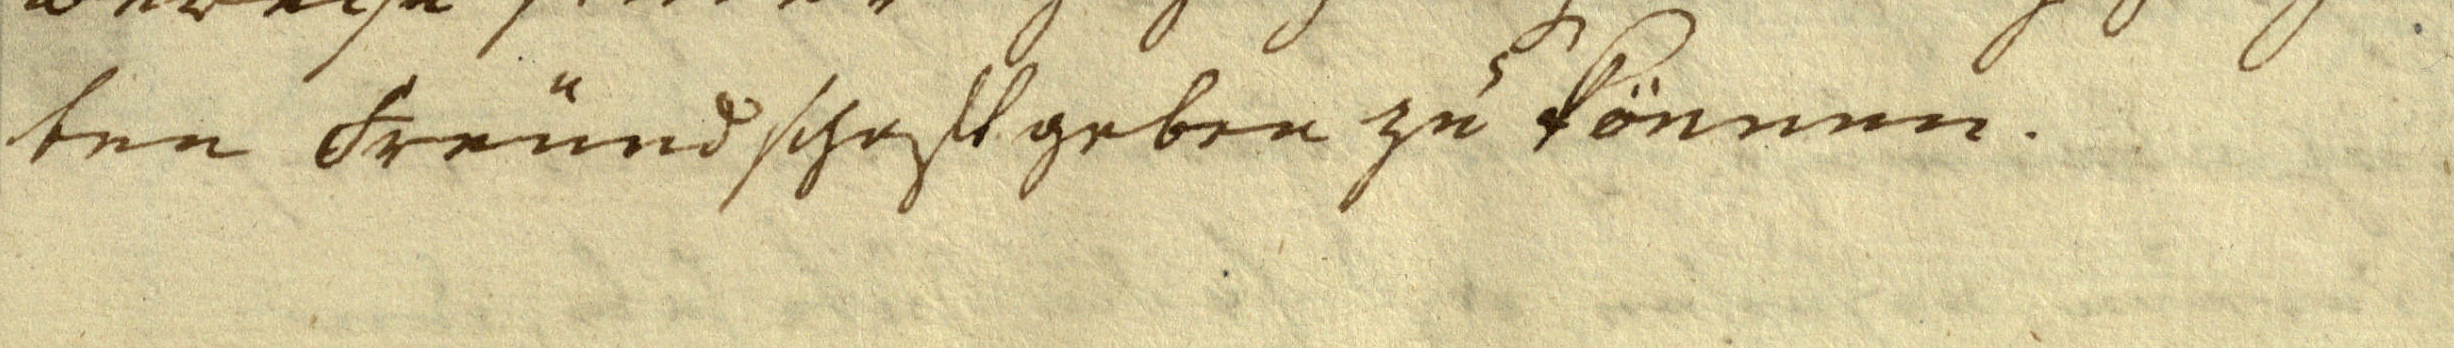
ten Freundschaft geben zu können.
